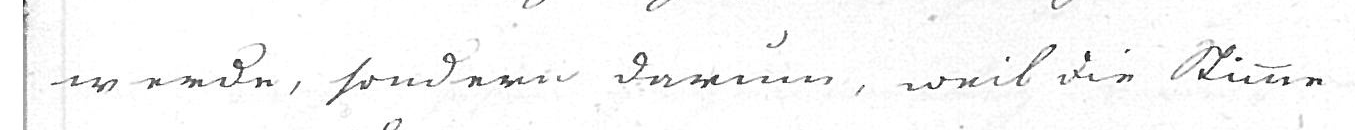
werde, sondern darum, weil die Stimme
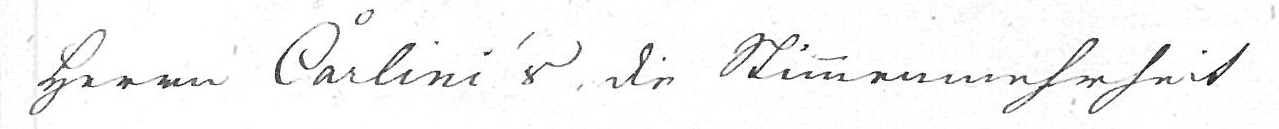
Herrn Carlini's die Stimmenmehrheit
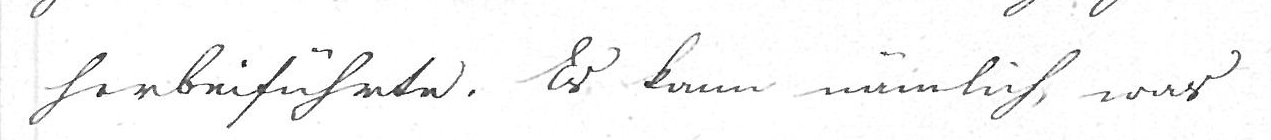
herbeiführte. Es kann nämlich, was
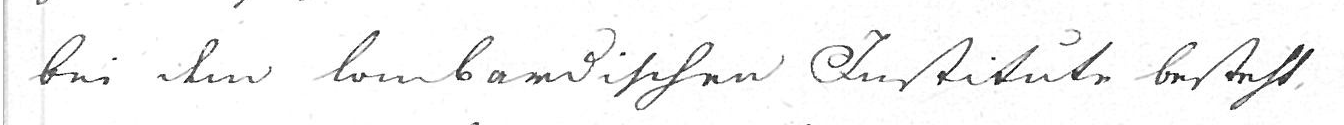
bei dem lombardischen Institute besteht
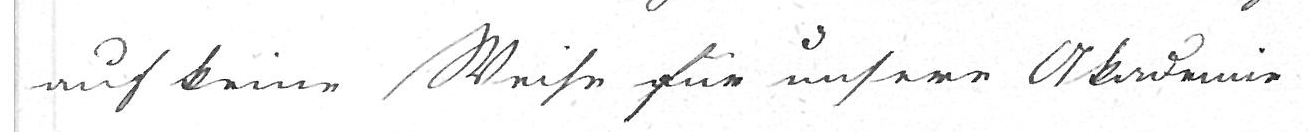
auf keine Weise für unsere Akademie
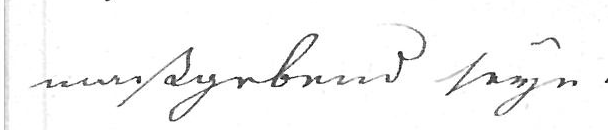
maßgebend seyn.
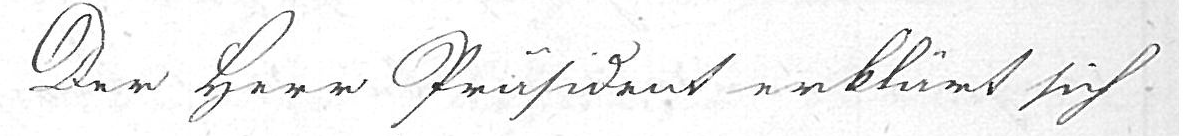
Der Herr Präsident erklärt sich
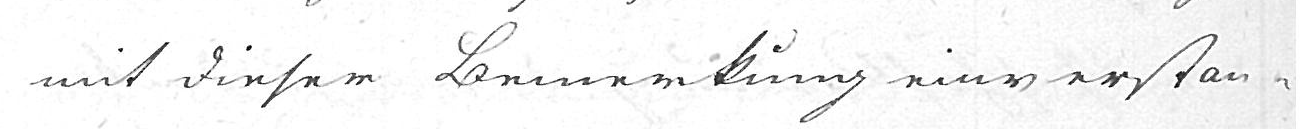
mit dieser Bemerkung einverstan-
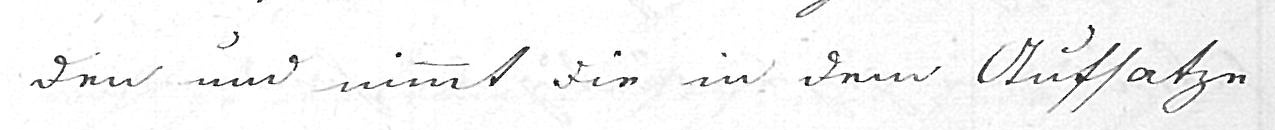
den und nimmt die in dem Aufsatze
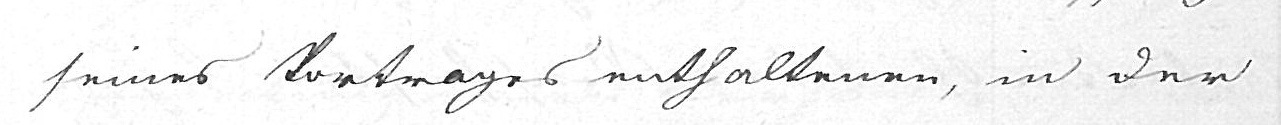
seine Vortrages enthaltenen, in der
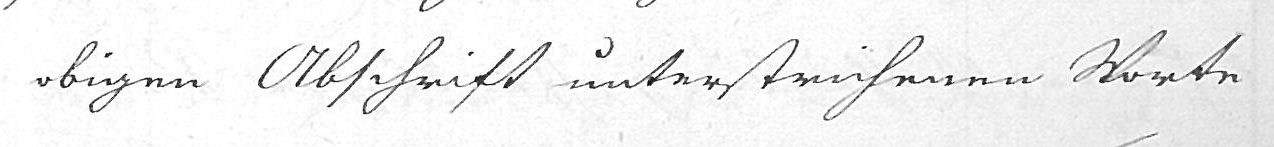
obigen Abschrift unterstrichenen Worte
